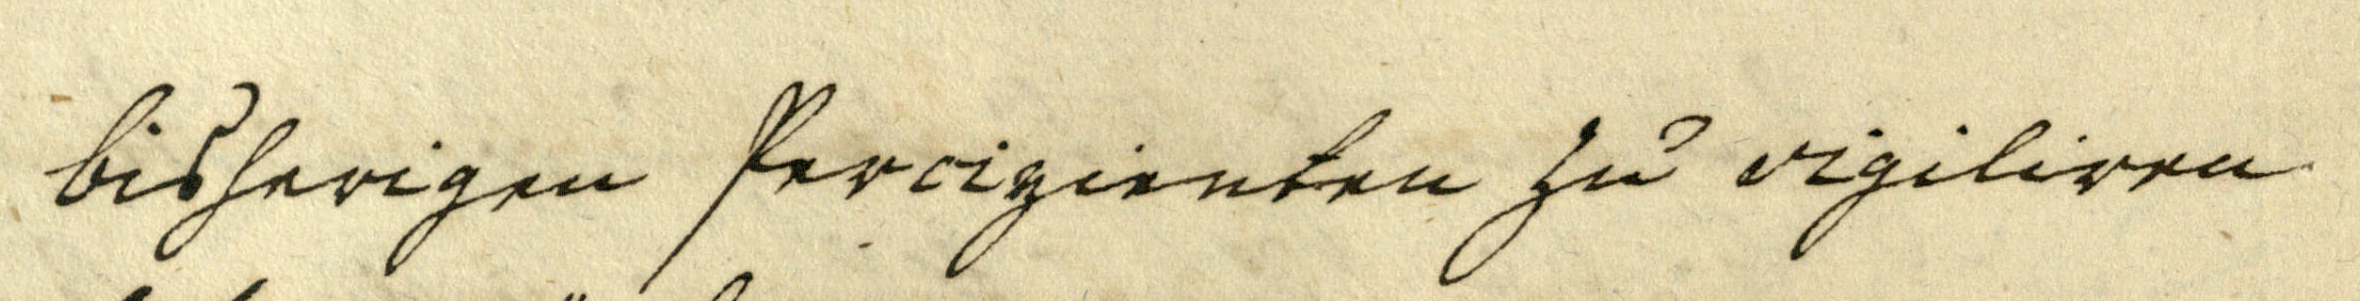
bisherigen Percipienten zu vegiliren
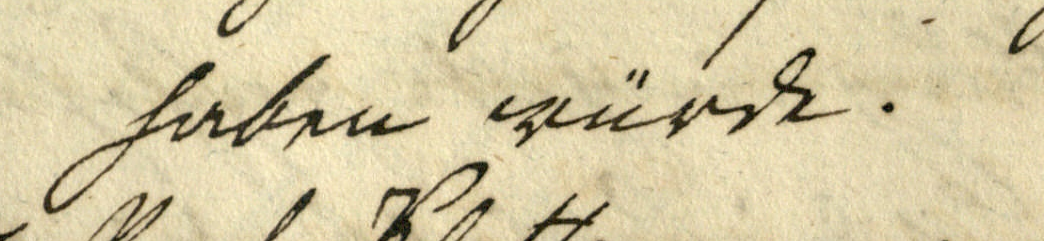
haben würde.
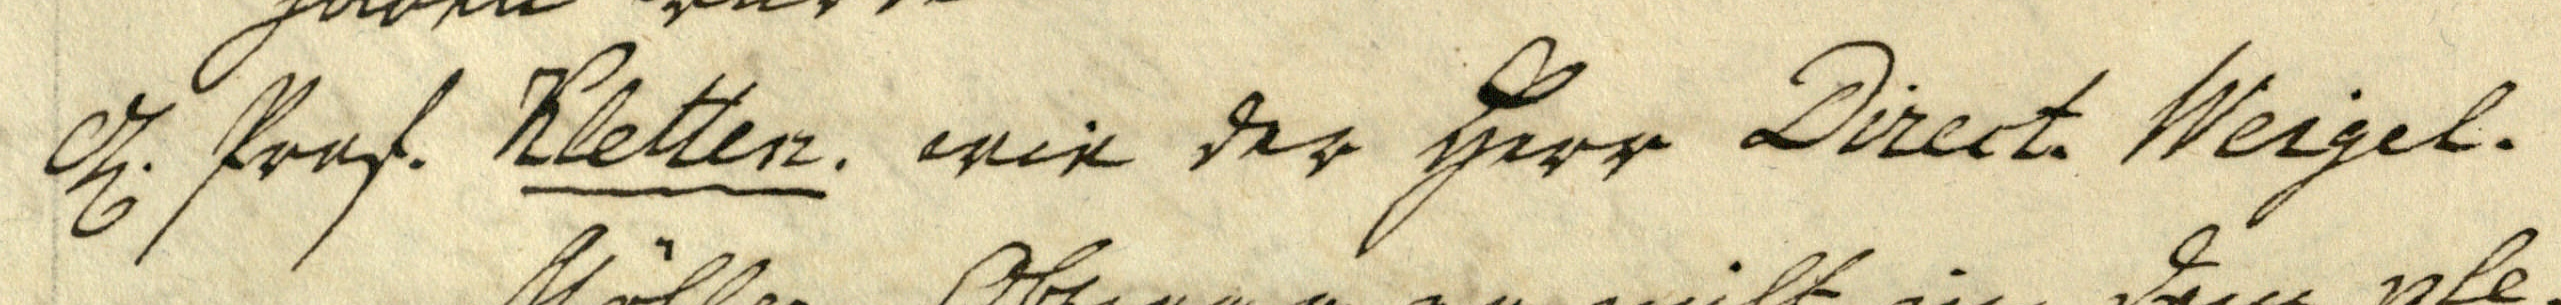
dh. Prof. Kletten. wie der Herr Direct. Weigel.
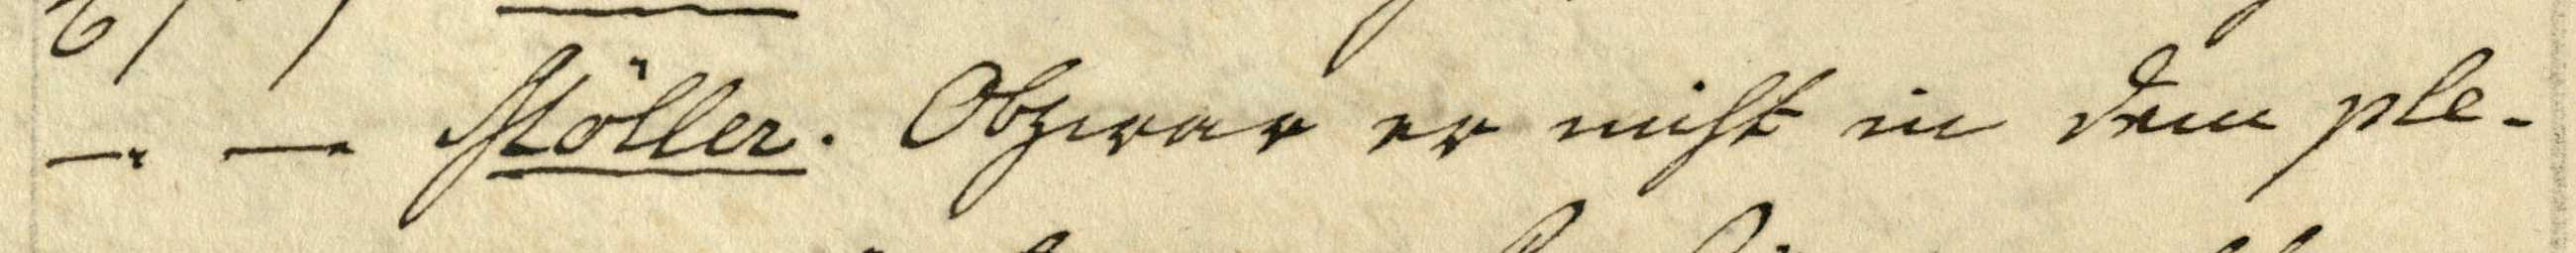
Möller. Ozwar er nicht in dem ple¬
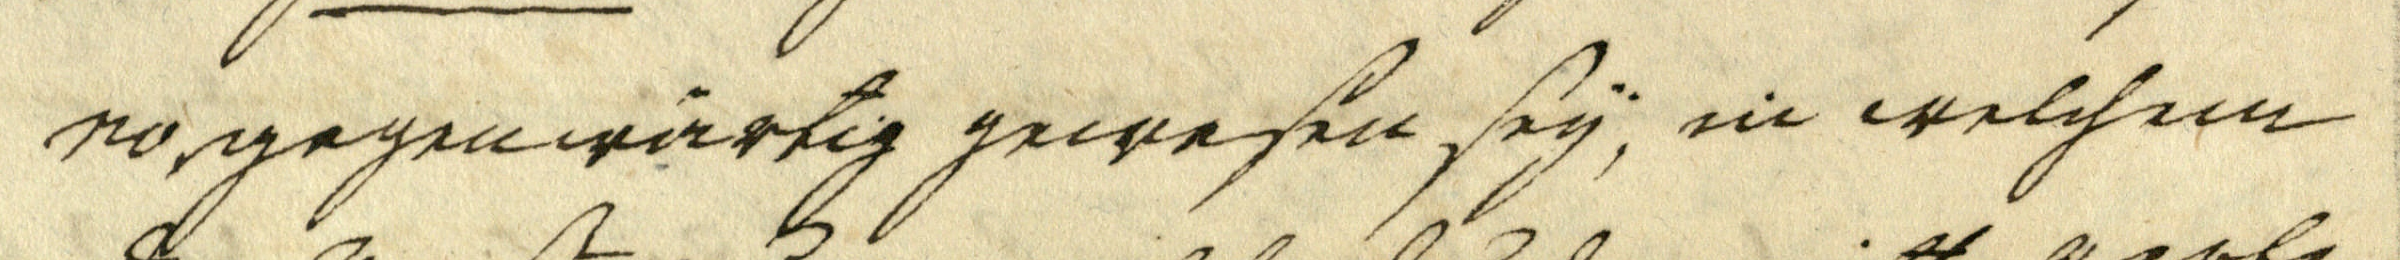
no gegenwärtig gewesen seÿ, in welchem
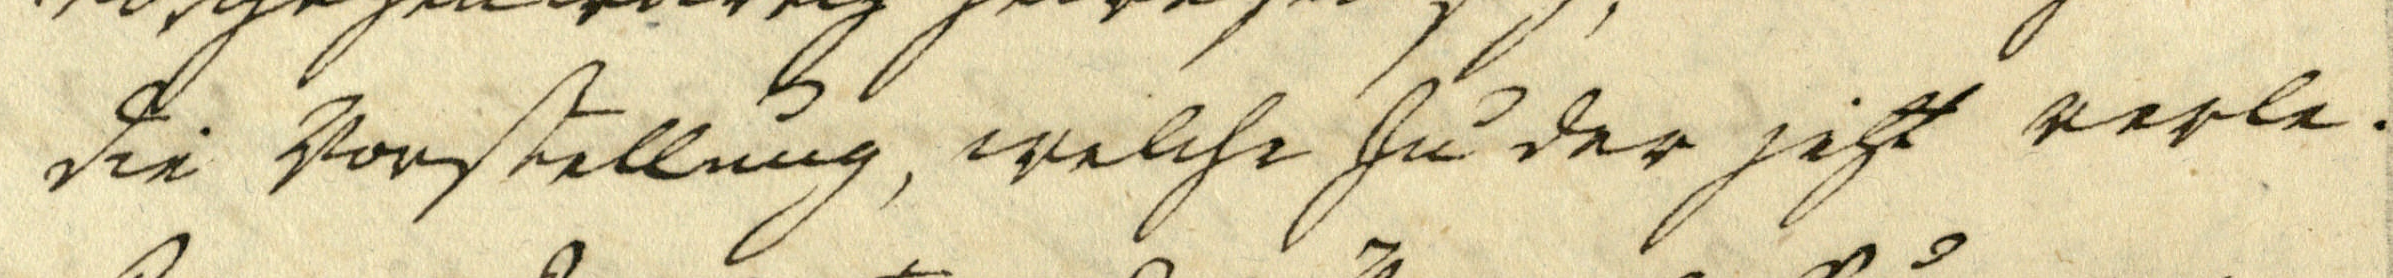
die Vorstellung, welche zu der jetzt verle¬
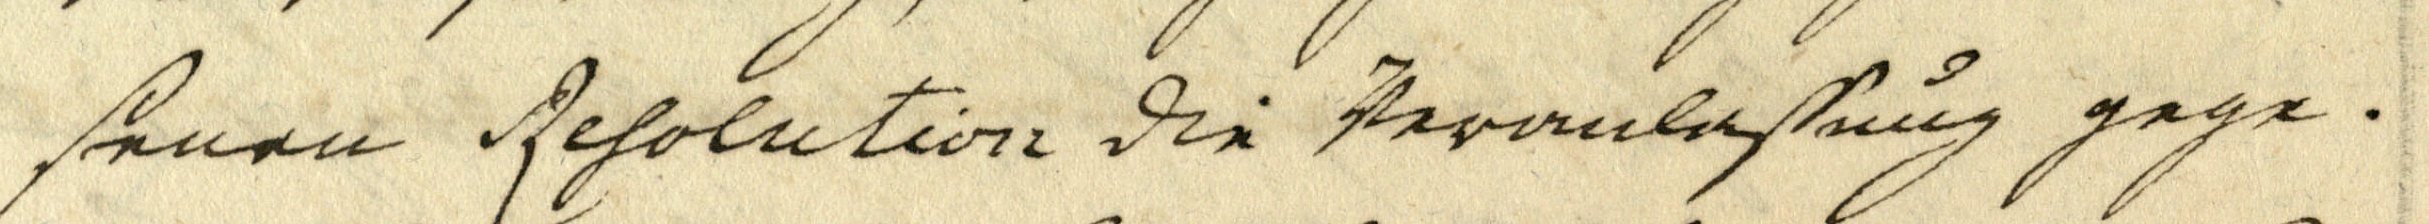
senen Resolution die Veranlassung gege¬
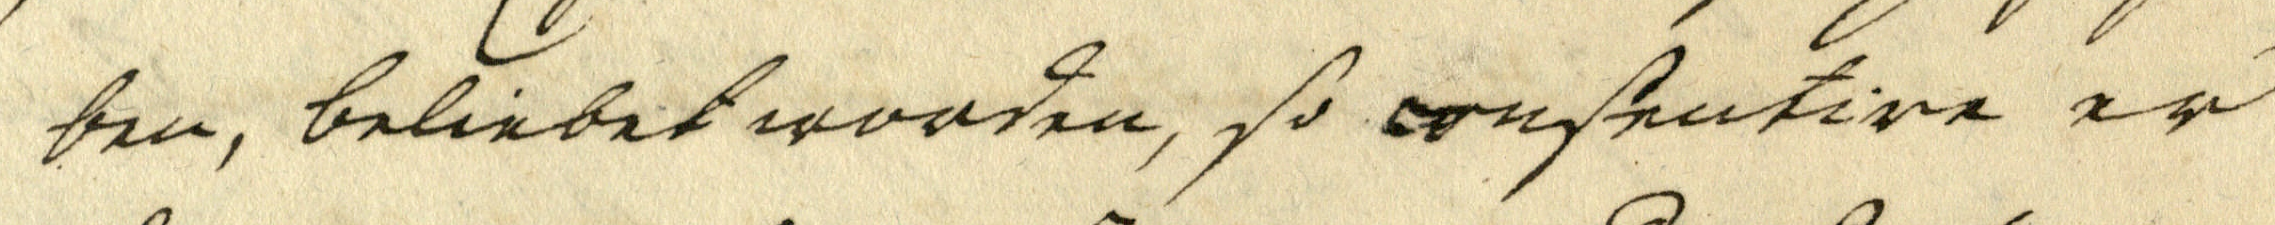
ben, beliebet worden, so consentire er
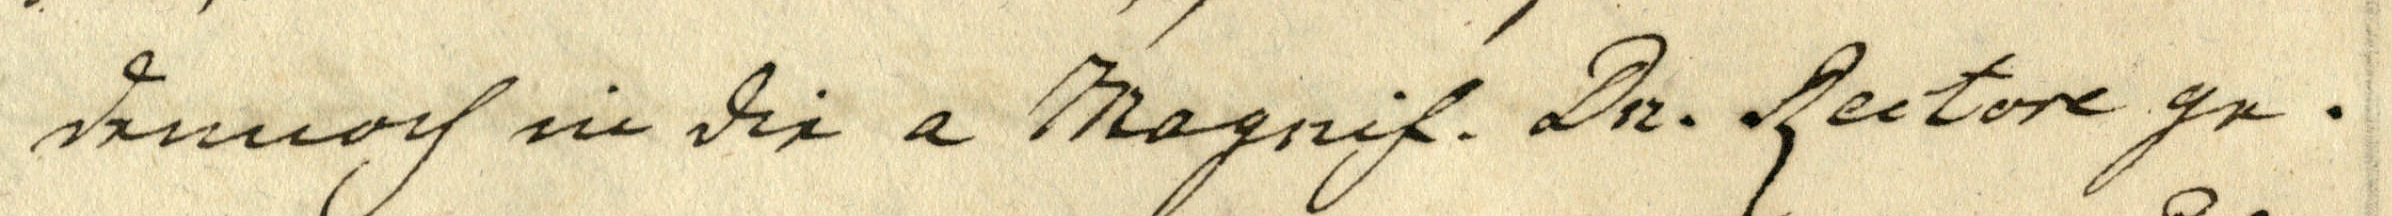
dennoch in die a Magnif. Dn. Rectore ge¬
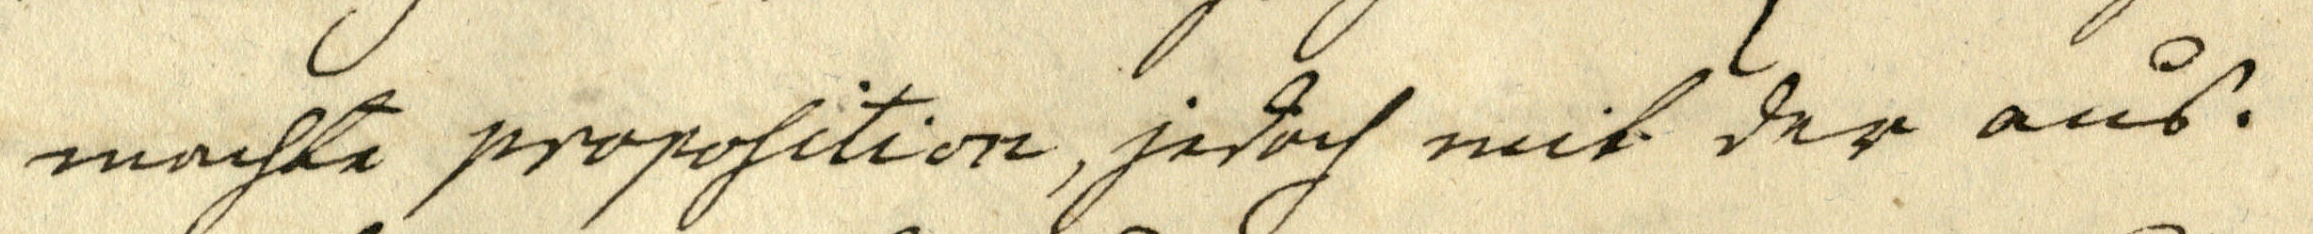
machte proposition, jedoch mit der aus¬
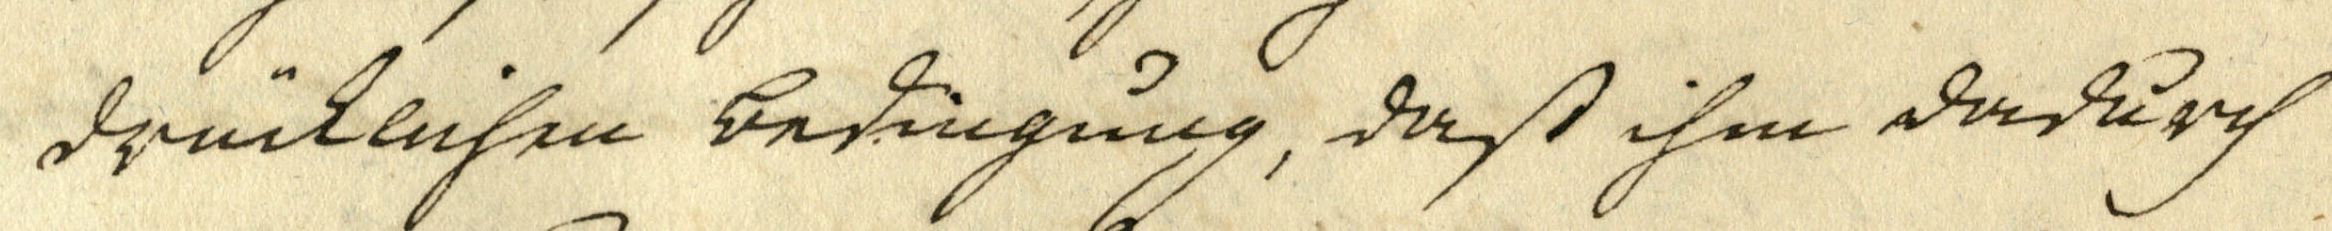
drücklichen Bedingung, daß ihm dadurch
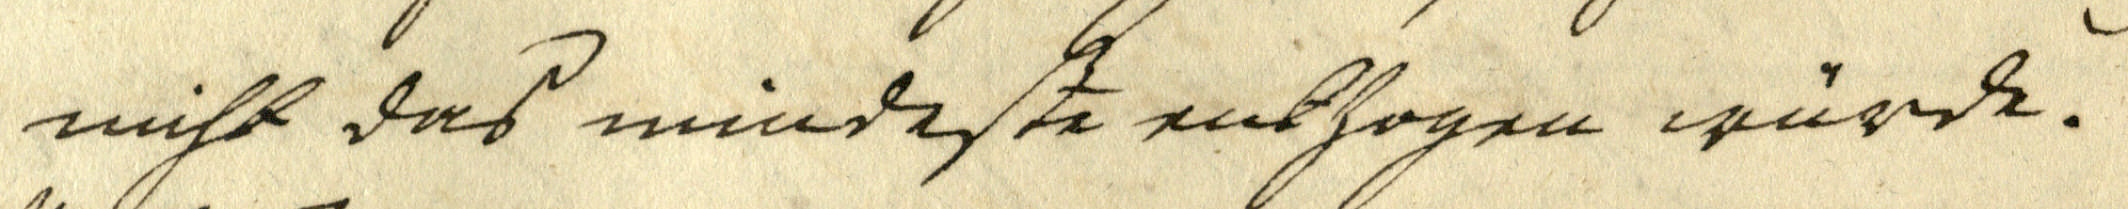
nicht das mindeste entzogen würde.
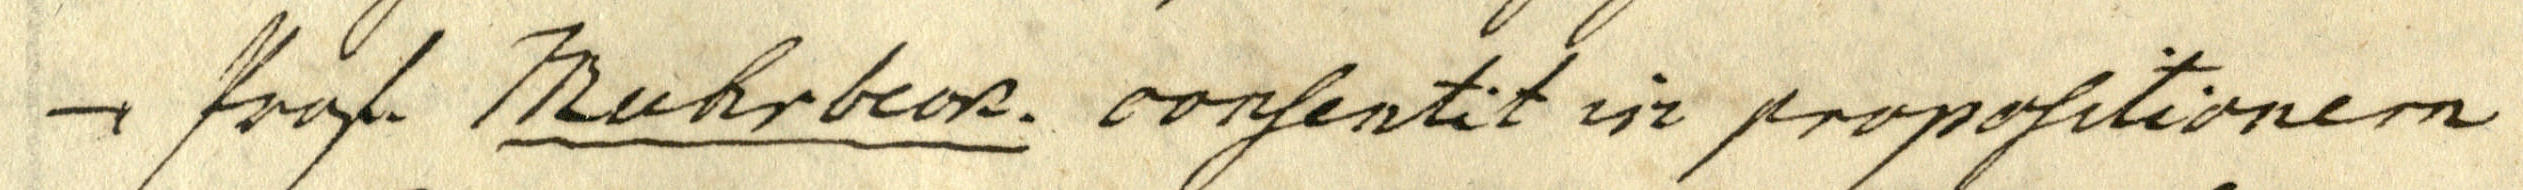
Prof. Muhrbeck. consentit in propositionem
